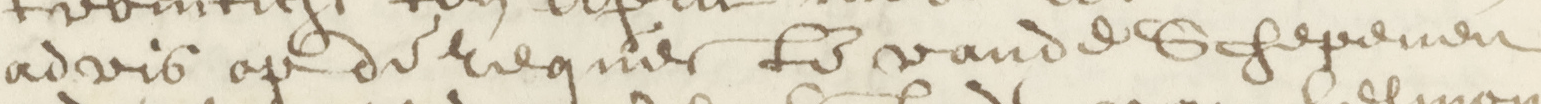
advis op de requeste vande Schepenen
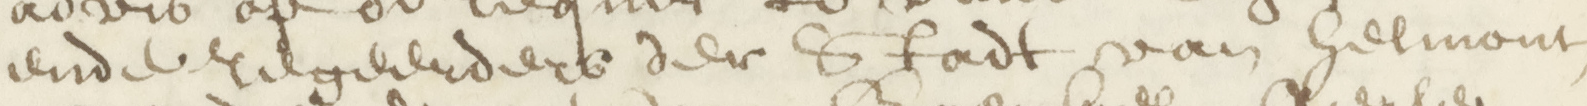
ende Regeerders der Stadt van Helmont,
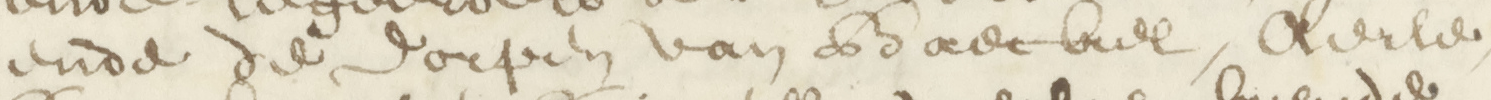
ende de Dorpen van Baeckel, Aerle,
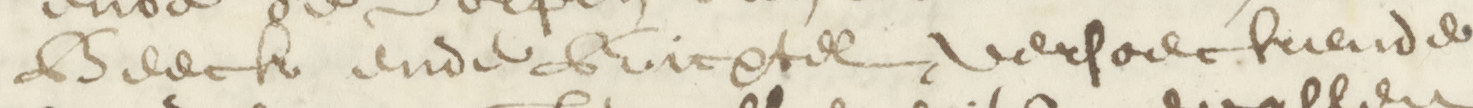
Beeck ende Ricxtel, versoeckende
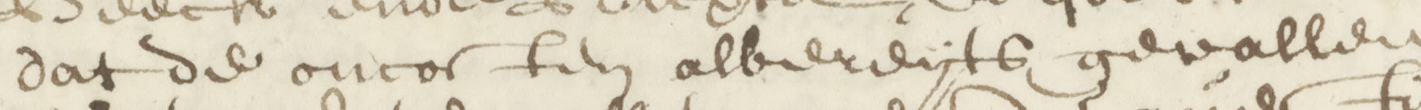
dat de oncosten albereijts gevallen
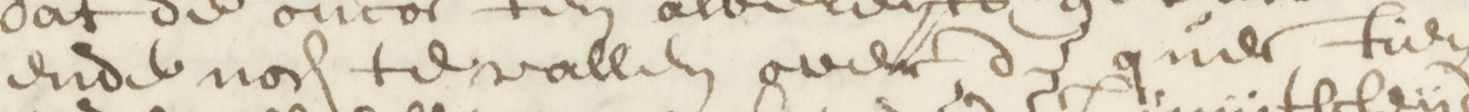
ende noch te vallen over de questien
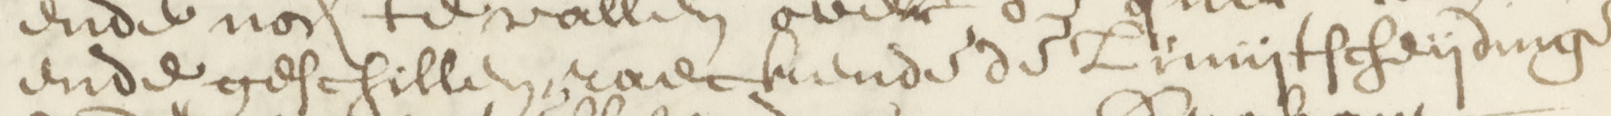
ende geschillen, raeckende de Limijtscheijdinge
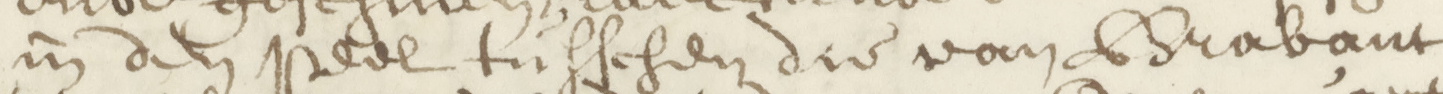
in den Peel tusschen die van Brabant
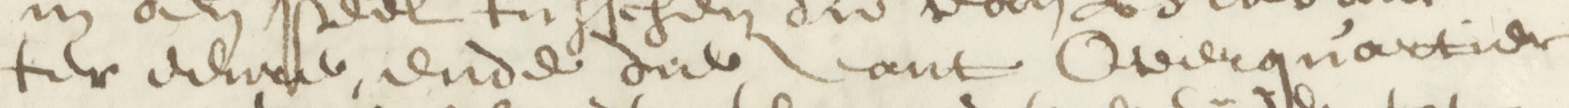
ter eenre ende die vant Overquartier
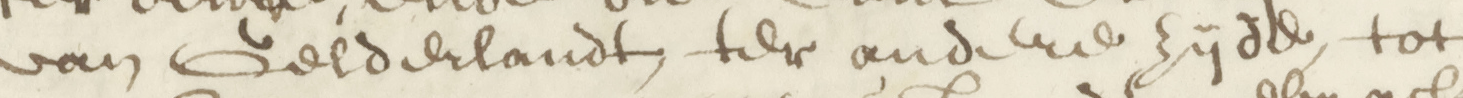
van Gelderlandt, ter andere zijde, tot
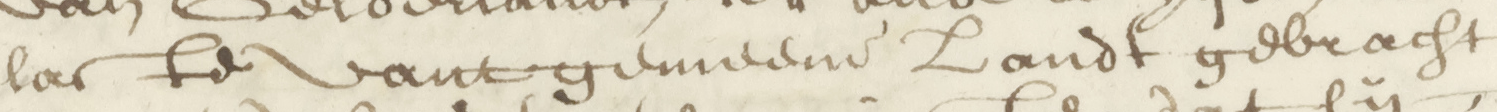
laste vant gemeene Landt gebracht
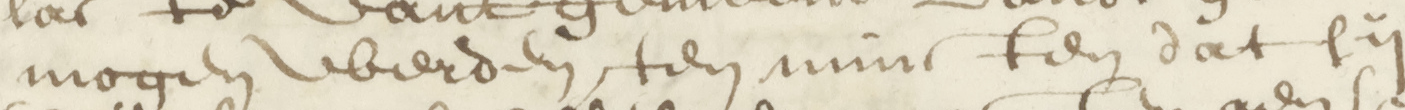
mogen werden, ten minsten dat sij
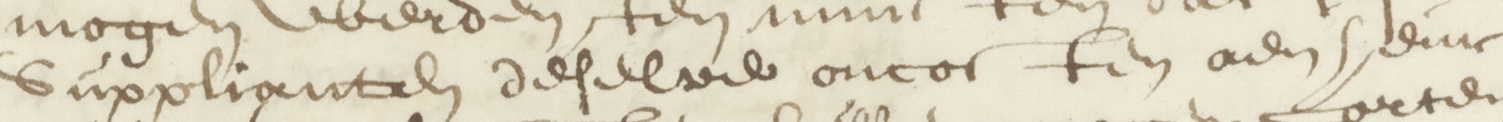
Supplianten deselve oncosten aen heur
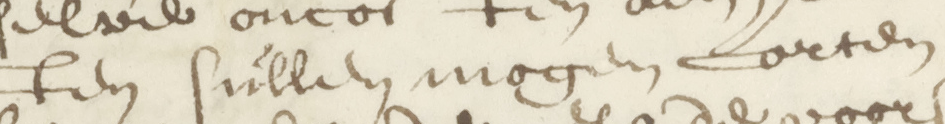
Comptoirlasten sullen mogen corten:
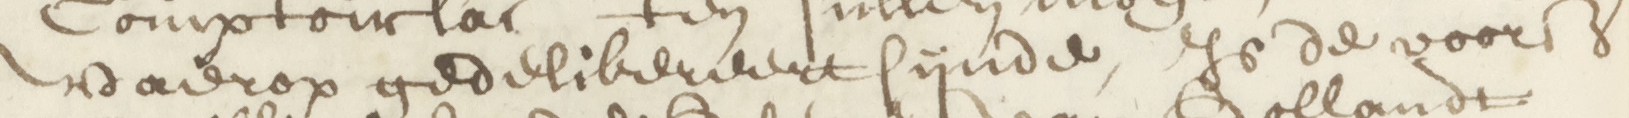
Waerop gedelibereert sijnde, Is de voors
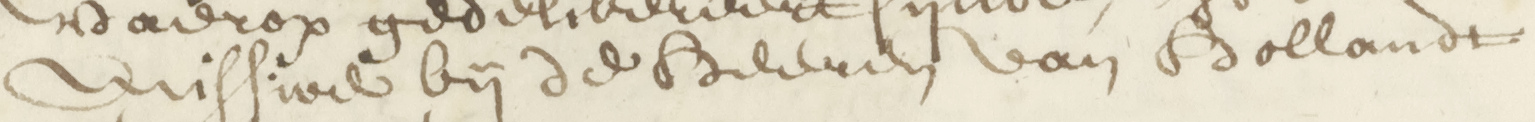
Missive bij de Heeren van Hollandt
